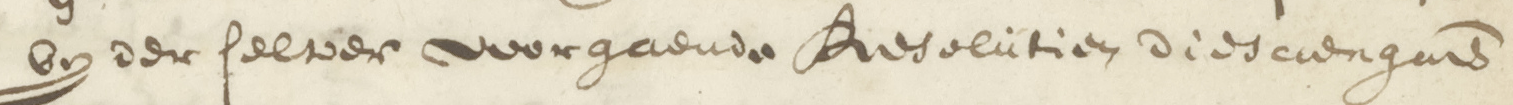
by der selver voorgaende Resolutien diesaengaen
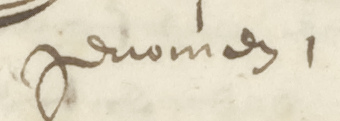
genomen.
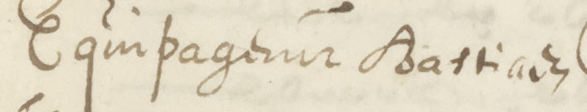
Eqiupagemr Bastiaen
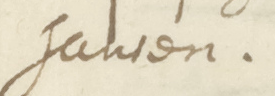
Jansen.
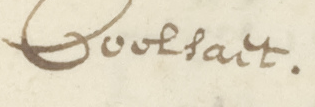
Coolsaet.
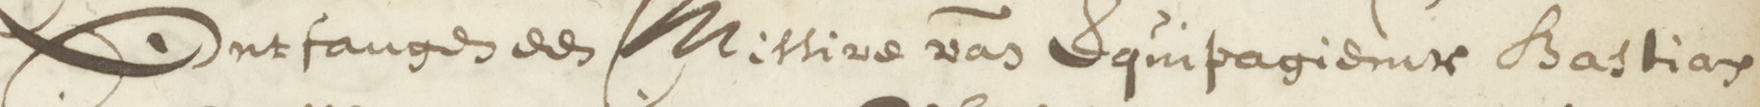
Ontfangen een Missive van Equipagiemr Bastiaen
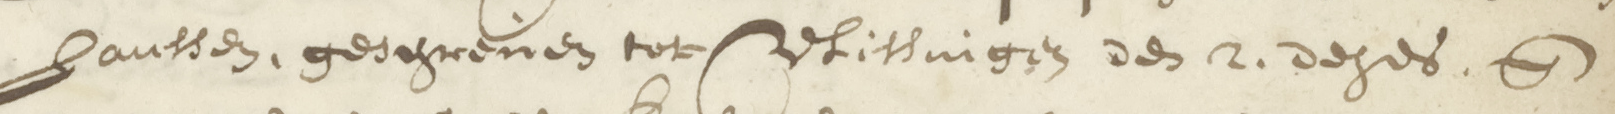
Janssen, geschreuen tot Vlissingen den 2. deses, &
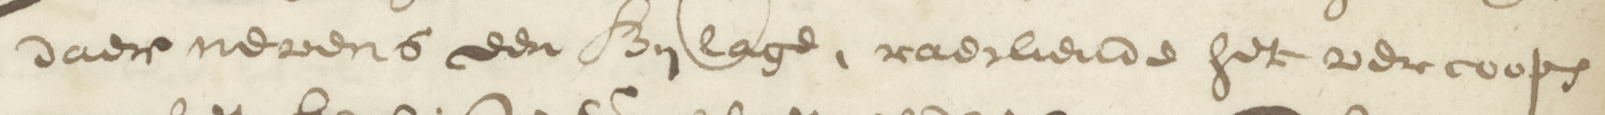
daer nevens een Bijlage, raeckende het vercoopen
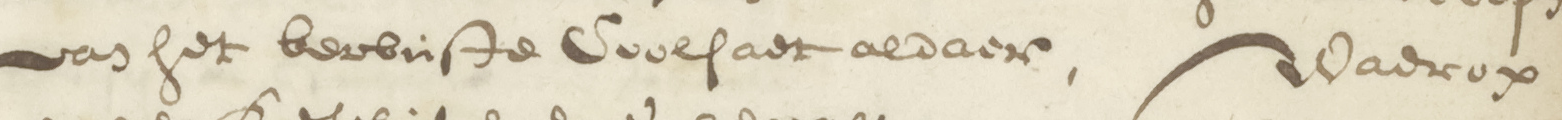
van het bewuste Coolsaet aldaer. Waerop
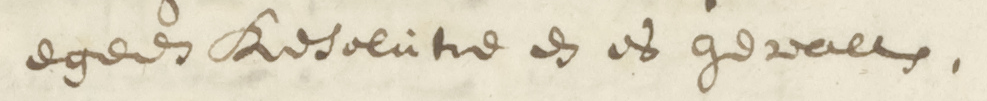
egeen Resolutie en es gevallen.
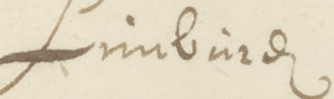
Limburch
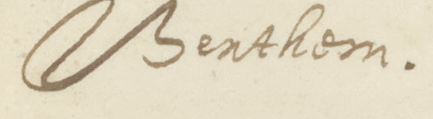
Benthem.
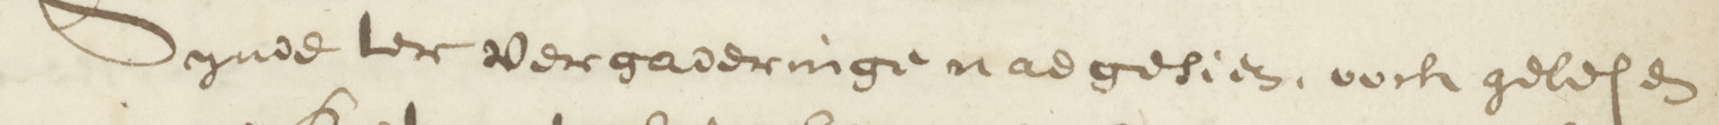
Synde ter Vergaderinge naegesien, oock gelesen
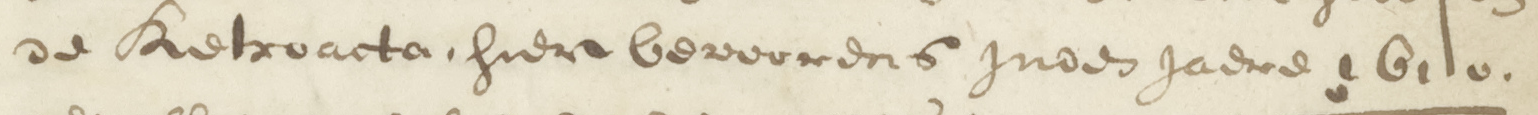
de Retroacta, hier bevoorens Inden Jaere 1610.
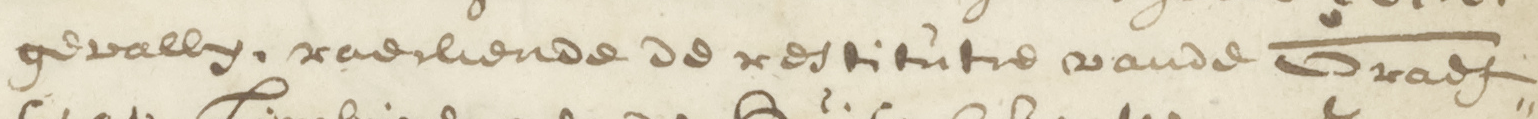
gevallen, raeckende de restitutie vande Graef„
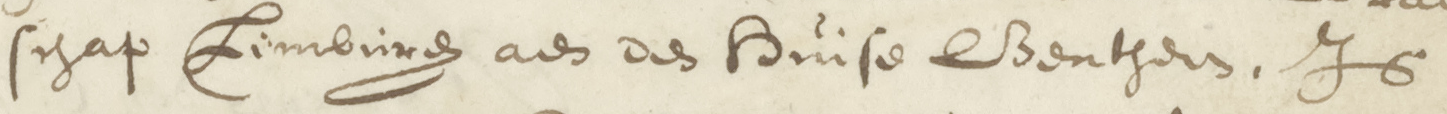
schap Limburch aen den Huise Benthem, Is —
